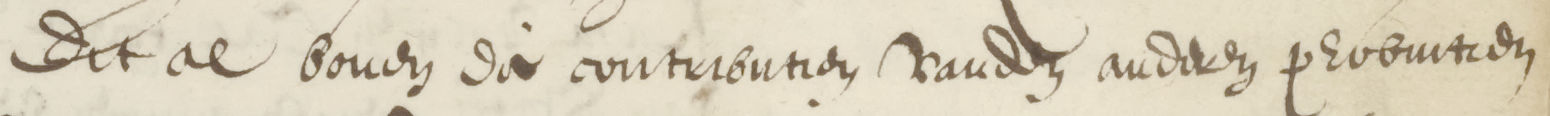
dit al bouen de contributien vanden anderen provintien
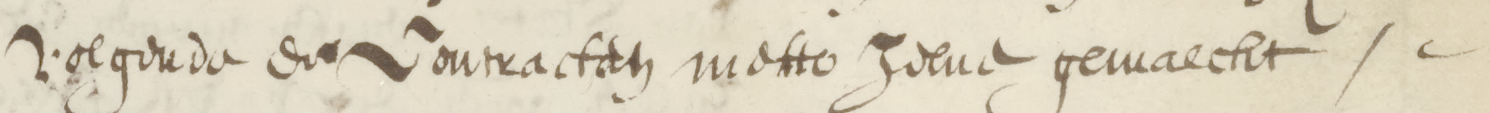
volgende de Contracten mette zelve gemaeckt.
